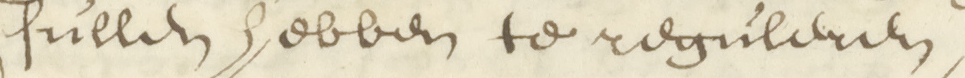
sullen hebben te reguleren;
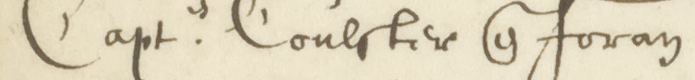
Captn. Coulster ca. Foran
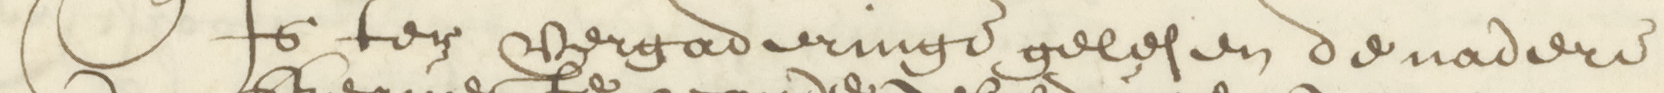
Is ter Vergaderinge gelesen de nadere
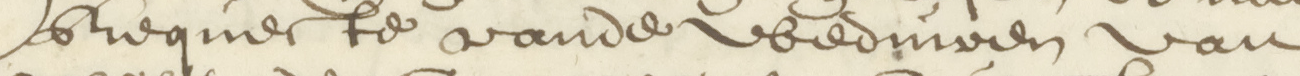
Requeste vande weduwen van
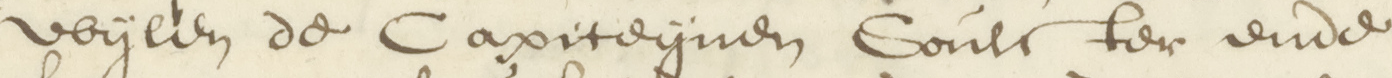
wijlen de Capiteijnen Coulster ende
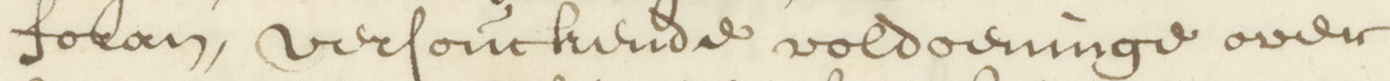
Foran, versouckende voldoeninge over
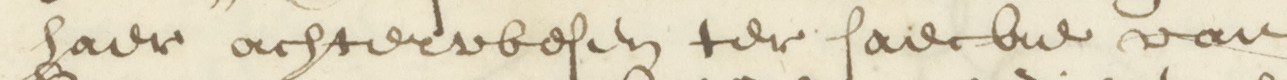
haer achterwesen ter saecke van
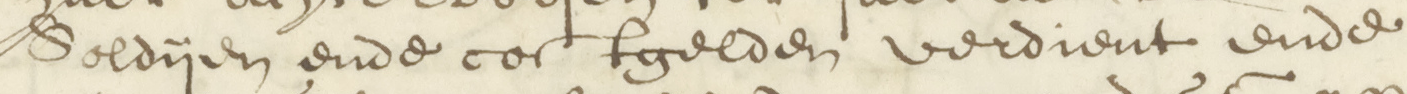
Soldijen ende costgelden verdient ende
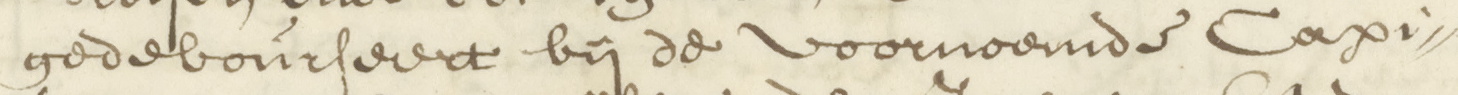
gedebourseert bij de voornoemde Capi,,
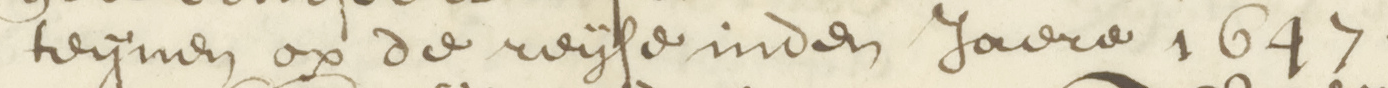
teijnen op de reijse inden Jaere 1647.
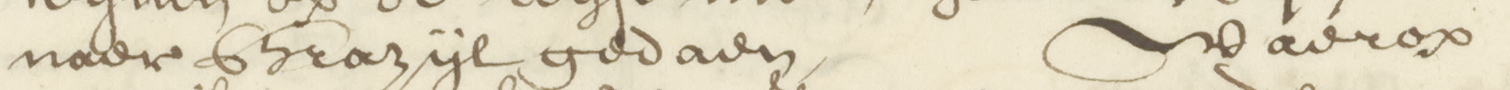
naer Brazijl gedaen. Waerop
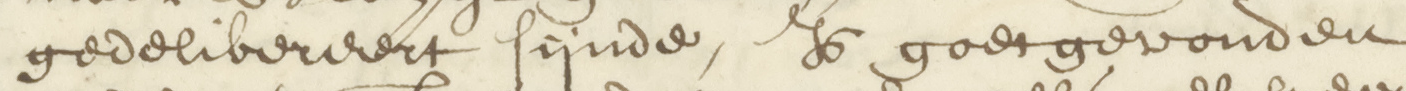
gedelibereert sijnde, Is goetgevonden
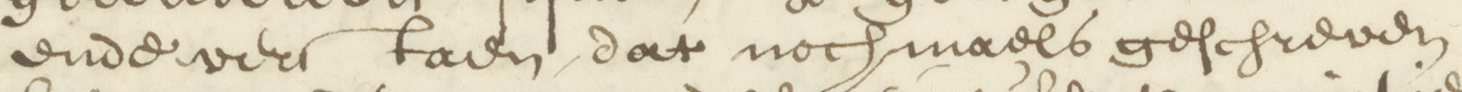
ende verstaen, dat nochmaels geschreven
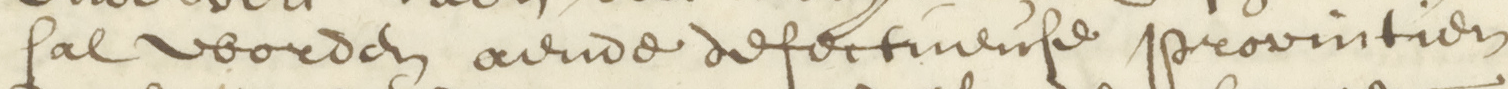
sal worden aende defectieuse Provintien
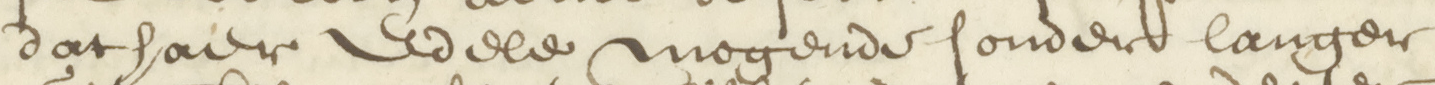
dat haer Edele mogende sondere langer
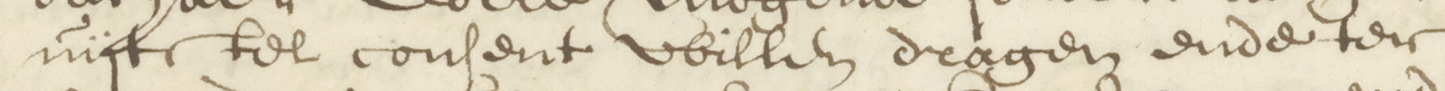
uijtstel consent willen dragen ende ter
